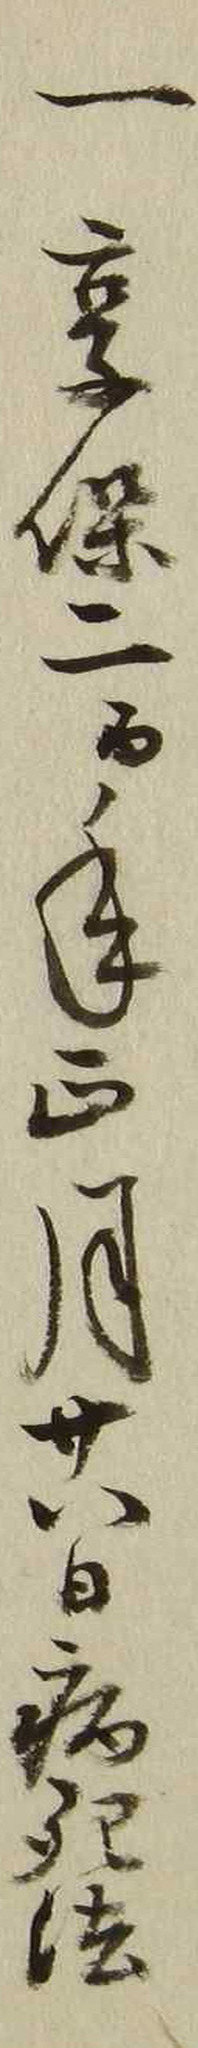一享保二酉年正月廿八日病死法
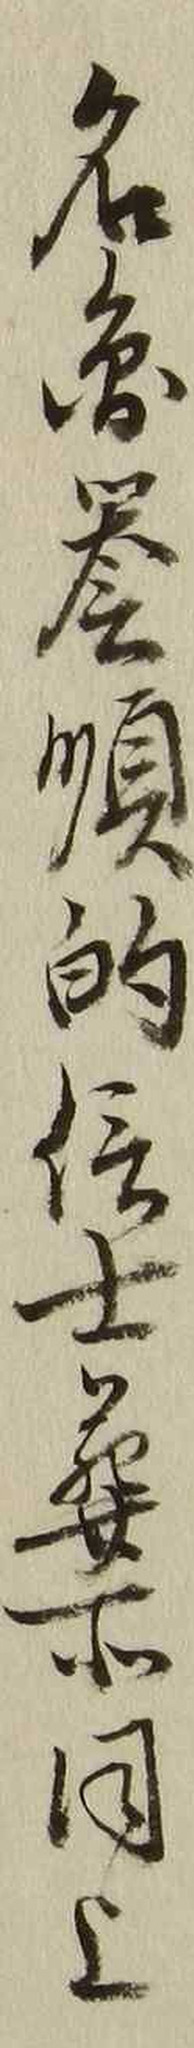名円誉順的信士葬所同上
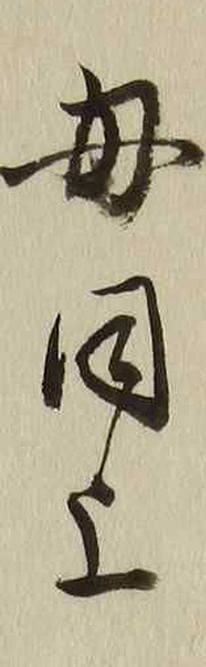母同上
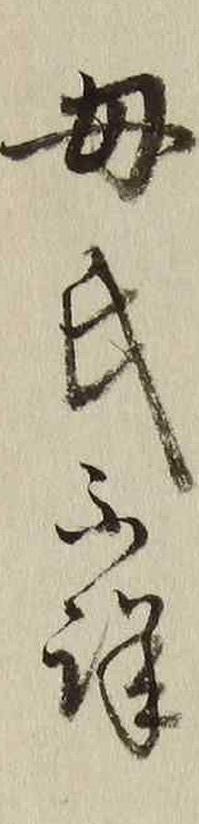母氏不詳
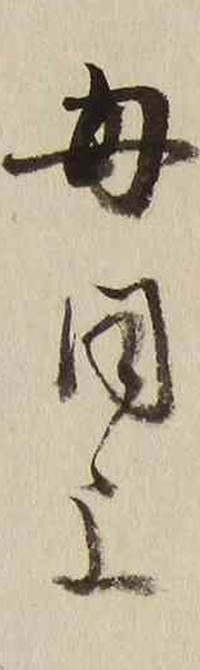母同上

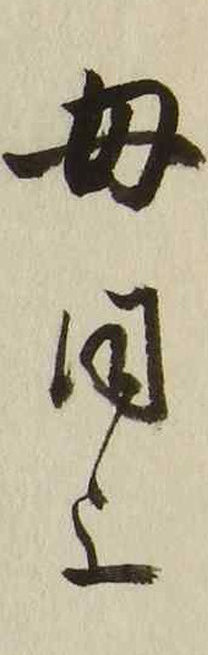母同上
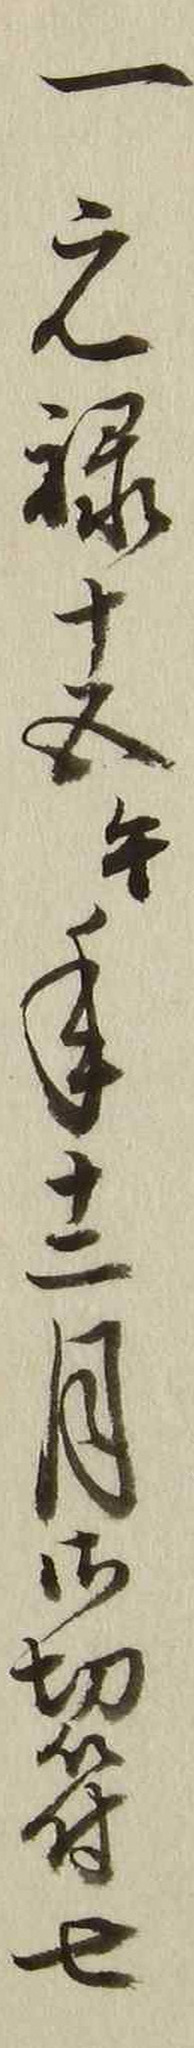一元禄十五午年十二月御切符七
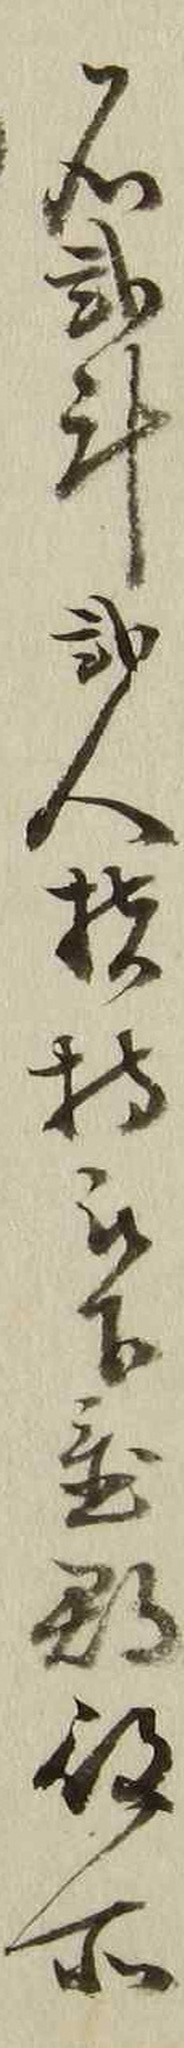石弐斗弐人扶持被下置郡役所
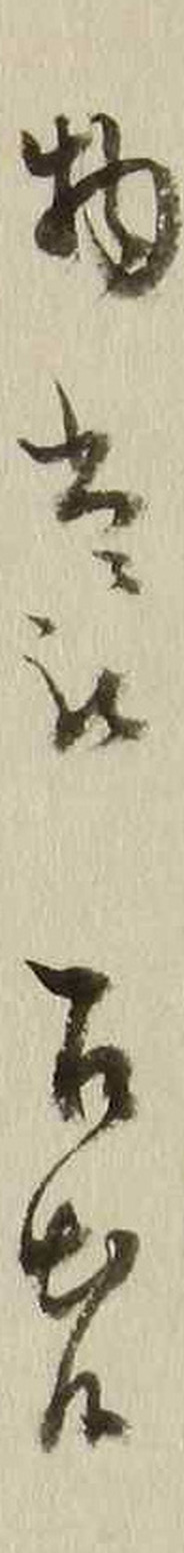物書ニ被召出候
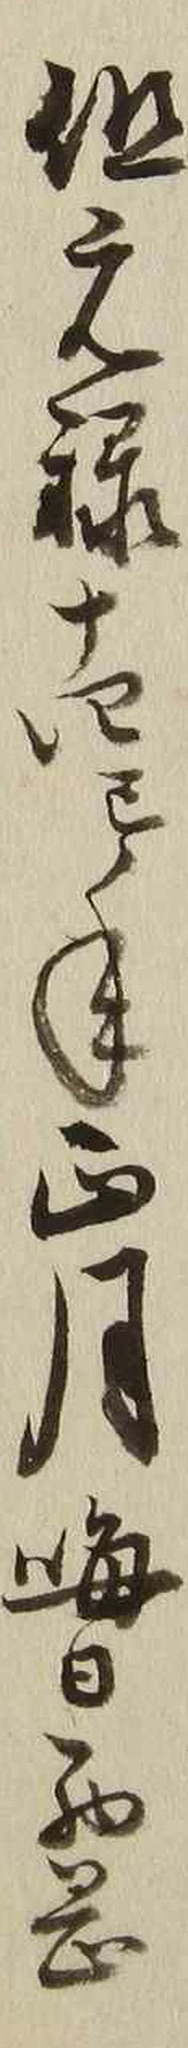但元禄十四巳年正月晦日西岡
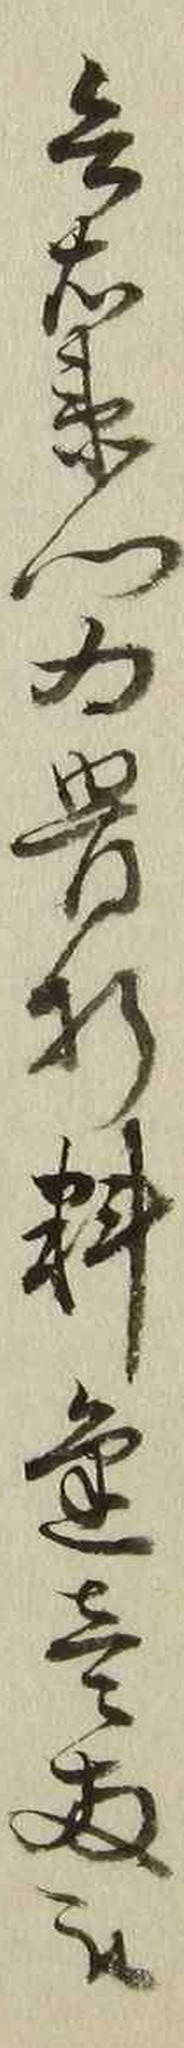兵右衛門為骨折料金壱両被
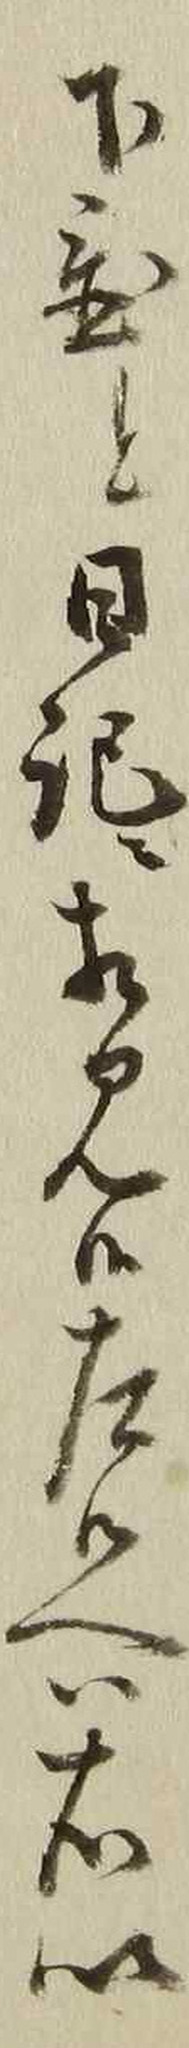下置と日記ニ相見御座候ヘハ右以
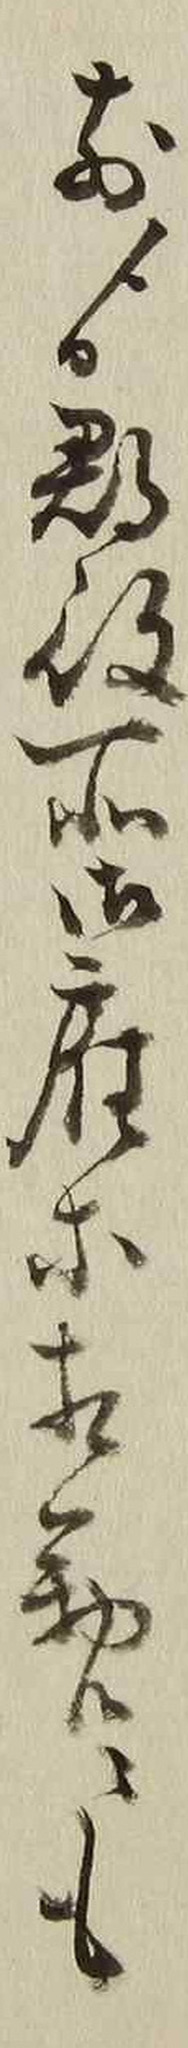前ゟ郡役所御雇等相勤候ニも
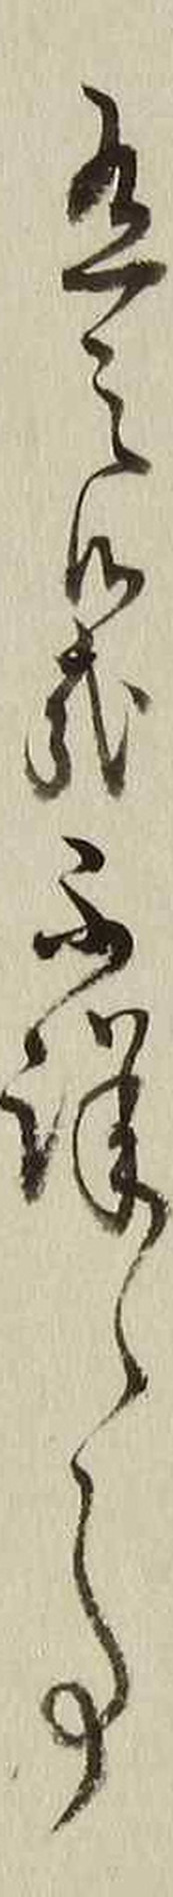有之候哉不詳候事
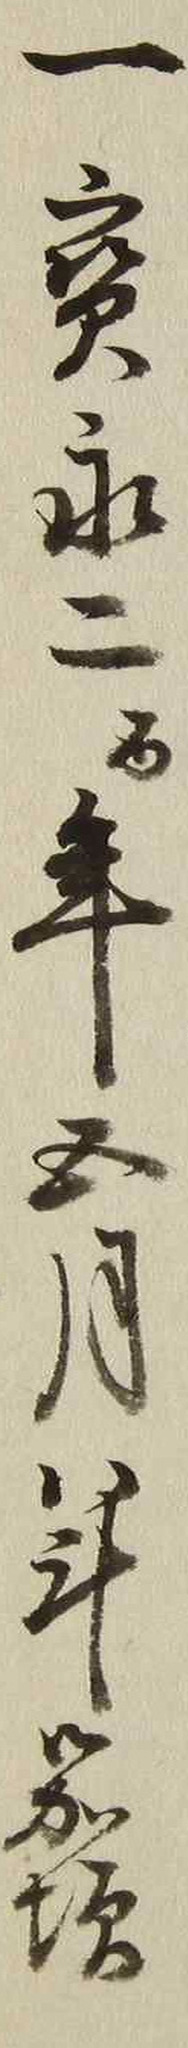一宝永二酉年五月八斗御加増
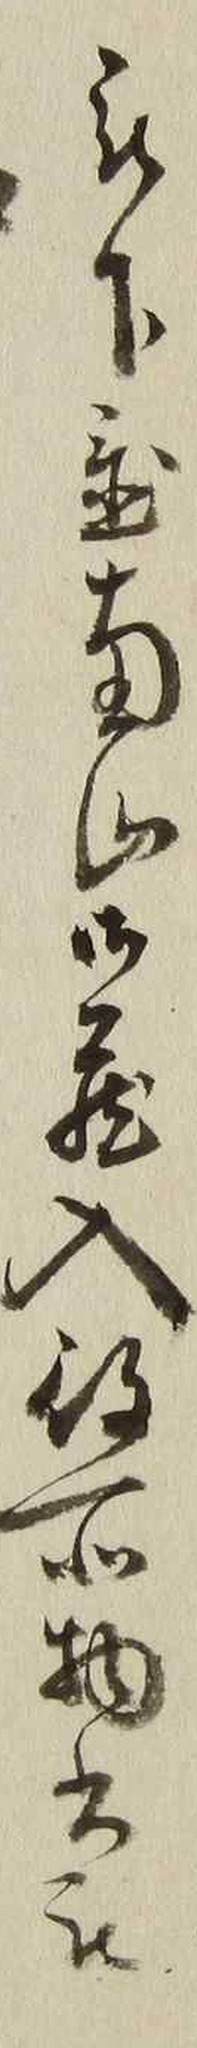被下置南山御蔵入役所物書被
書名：諸士系譜　巻之53　に之部4
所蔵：会津若松市立会津図書館
